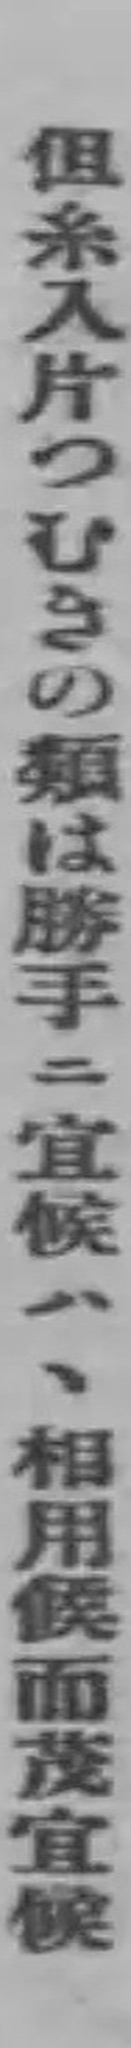但糸入片つむきの類は勝手ニ宜候ハヽ相用候而茂宜候
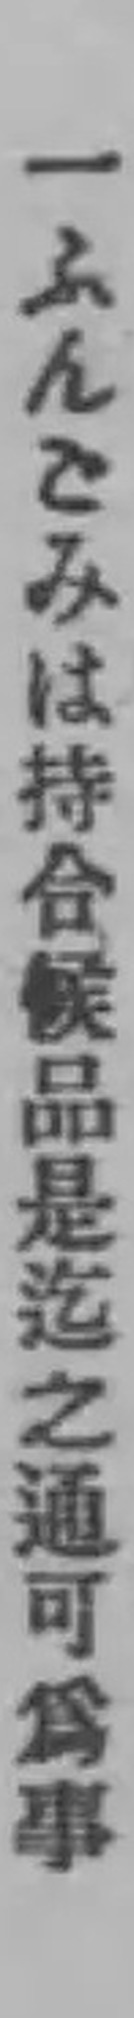一ふんごみは持合候品是迄之通可為事
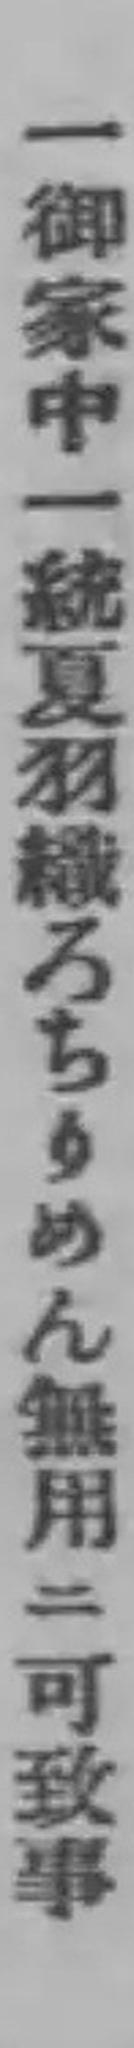一御家中一統夏羽織ろちりめん無用ニ可致事
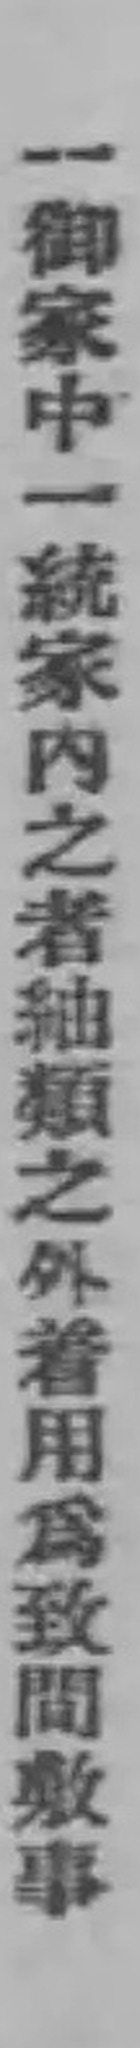一御家中一統家内之者袖類之外着用為致間敷事
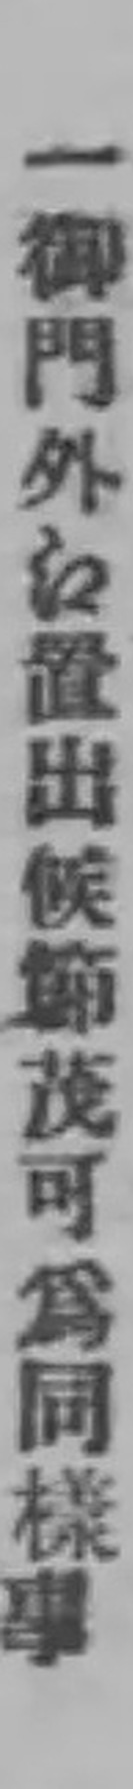一御門外え置出候節茂可為同様事
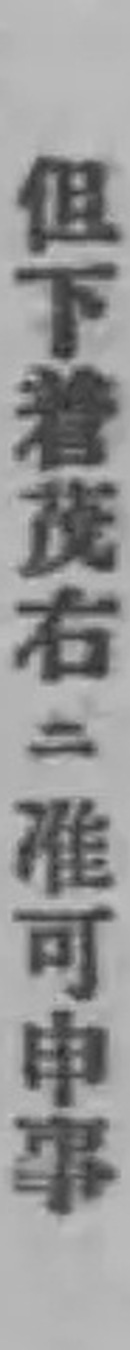但下着茂右ニ准可申事
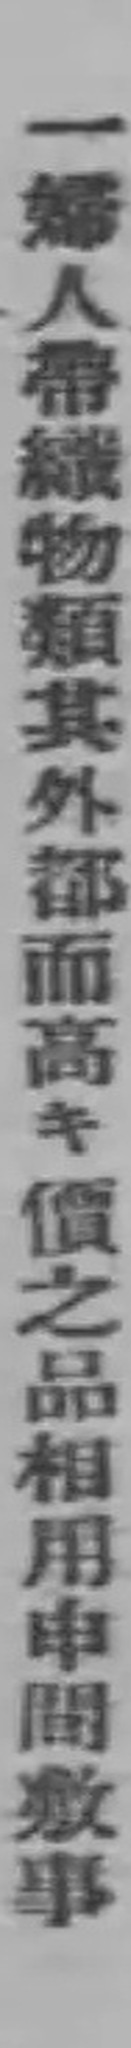一婦人帯織物類其外都而高キ価之品相用申間敷事
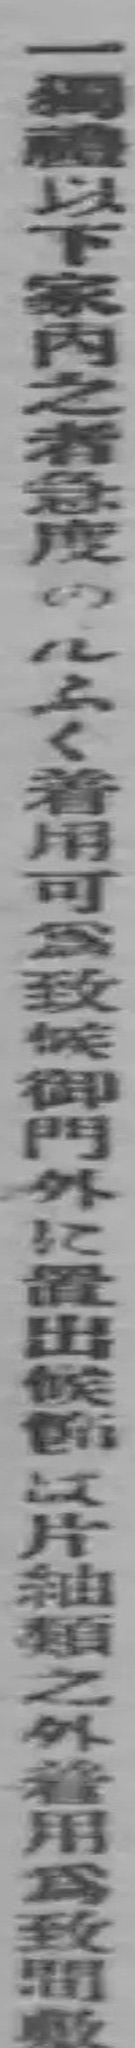一独礼以下家内之者急度めんふく着用可為致候門外に置出候節は片袖類之外着用為致間敷事

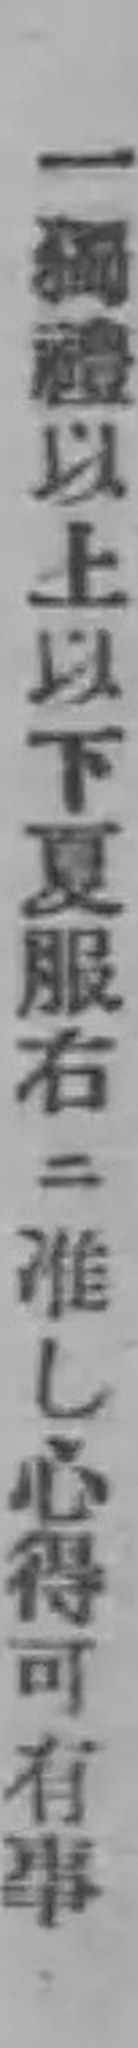一独礼以上以下夏服右ニ准し心得可有事
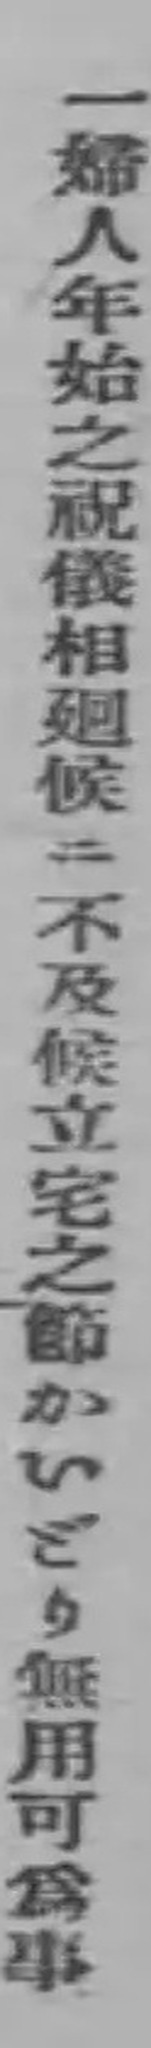一婦人年始之祝儀相廻候ニ不及候立宅之節かいどり無用可為事
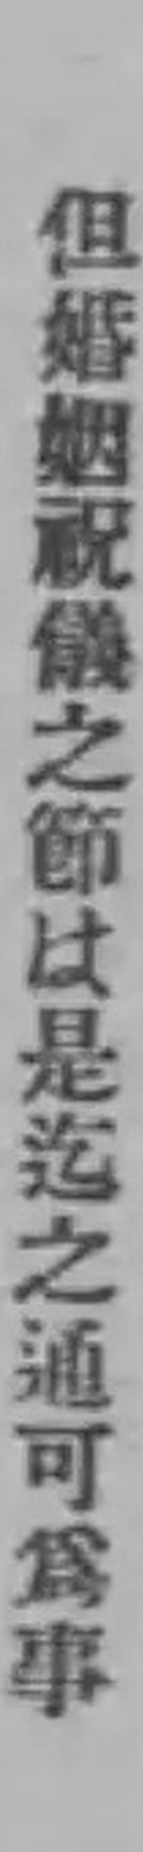但婚姻祝儀之節は是迄之通可為事
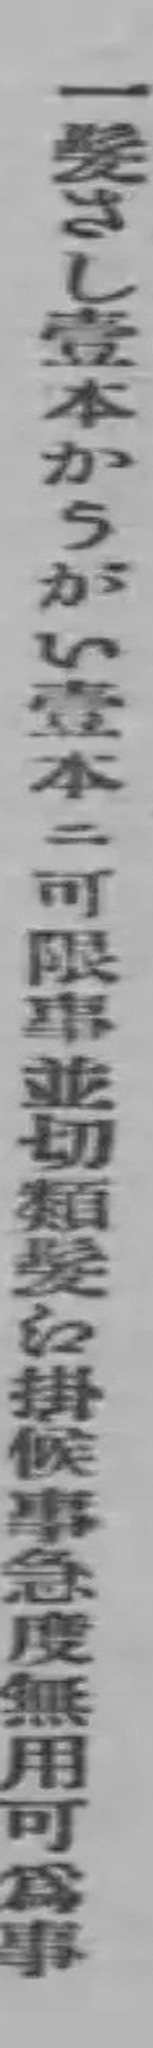一髪さし壱本かうがい壱本ニ可限事並切類髪え掛候事急度無用可為事
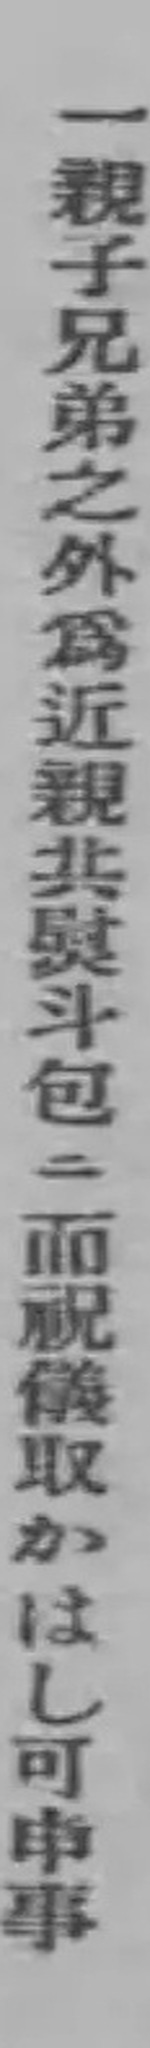一親子兄弟之外為近親共熨斗包ニ而祝儀取かはし可申事
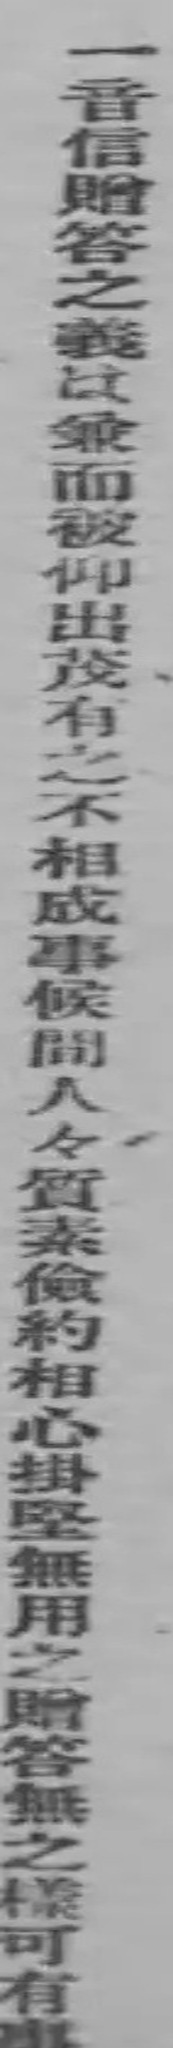一音信贈答之義は兼而被仰出茂有之不相成事候間人々質素倹約相心掛堅無用之贈答無之様可有事
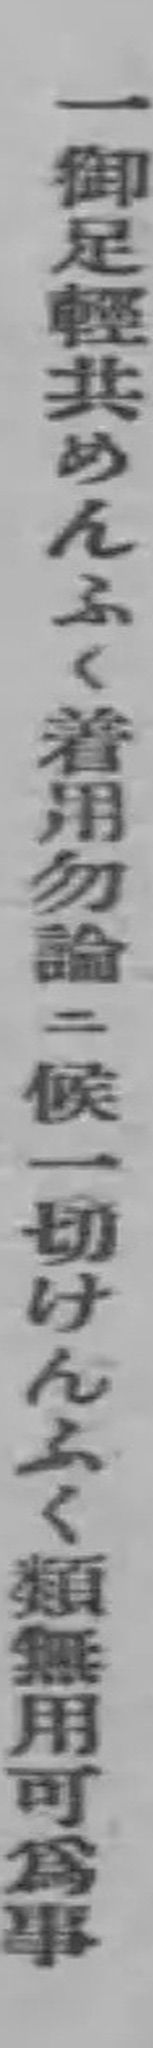一御足軽共めんふく着用勿論ニ候一切けんふく類無用可為事
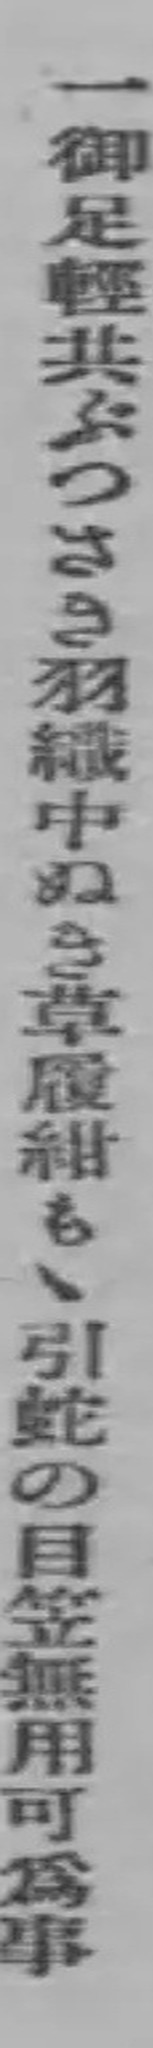一御足軽共ぶつさき羽織中ぬき草履紺もゝ引蛇の目笠無用可為事
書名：豊橋市史談
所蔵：国立国会図書館 National Diet Library, JAPAN
